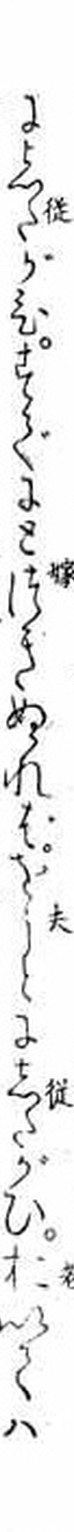にしたがひ。すでにとつきぬれば。をうとにしたがひ。おいては
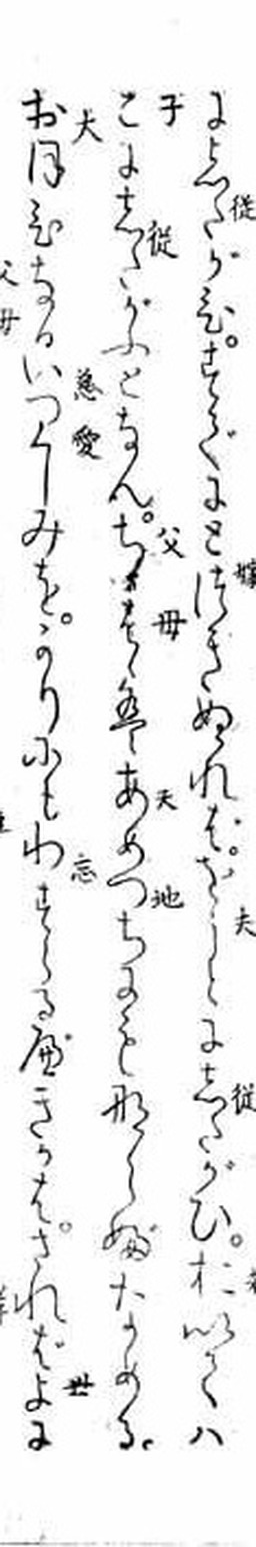こにしたがふとなん。ちゝはゝはあめつちにもならぶなめる。
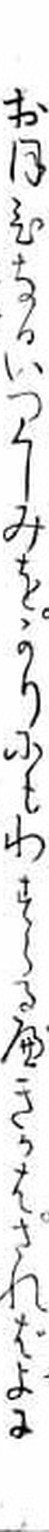おほひなるいつくしみを。かりにもわするゝべきかは。さればよに
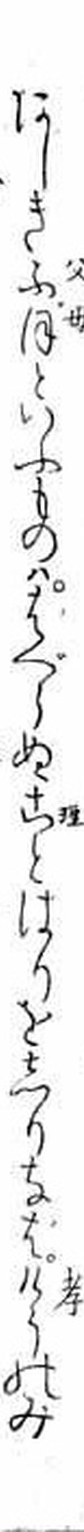あしきふぼといふものは。はべらぬことはりをしりなば。けうのみ
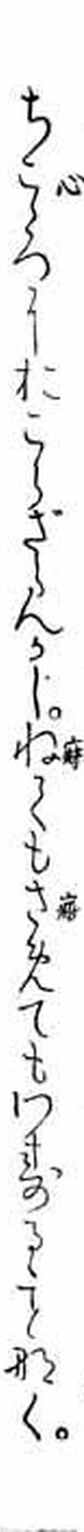ちこゝろにおこらざらんかし。ねてもさめてもわするゝことなく。

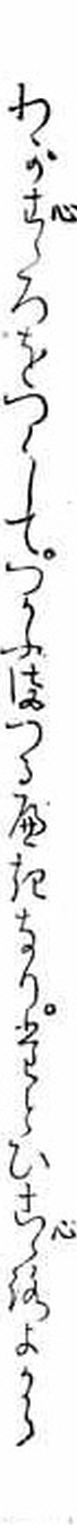わがこゝろをつくして。つかふまつるべきなり。たとひこゝろよから
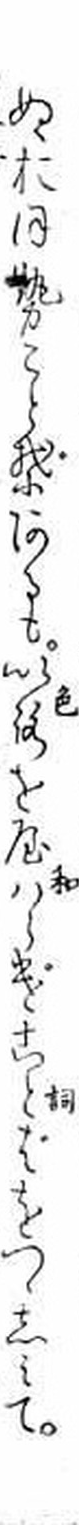ぬおほせことはあるも。いろをやはらげことばをつヽしみて。
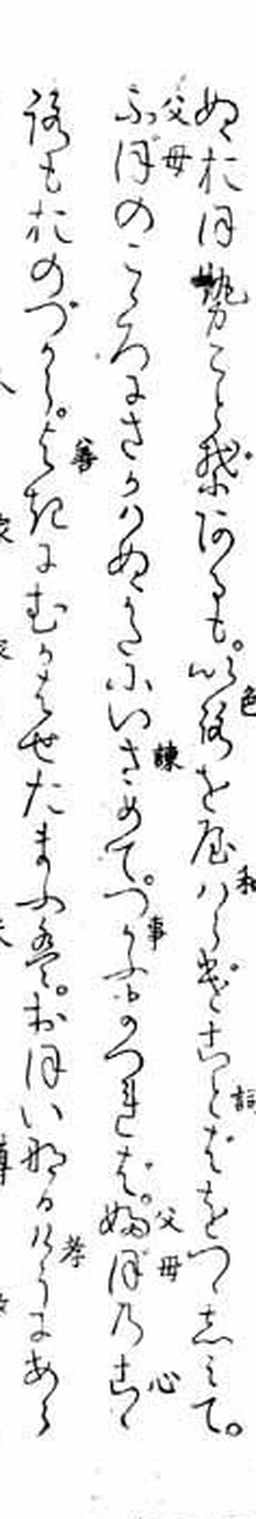ふぼのこゝろにさかはぬかたにいさめて。つかふまつれば。ふぼのこゝ
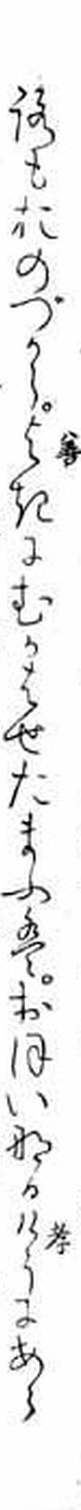ろもおのづから。よきにむかはせたまふは。おほいなるけうにあら
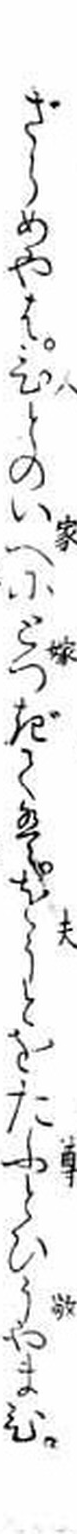ざらめやは。ひとのいへにとつぎては。をうとをたふとひうやまひ。
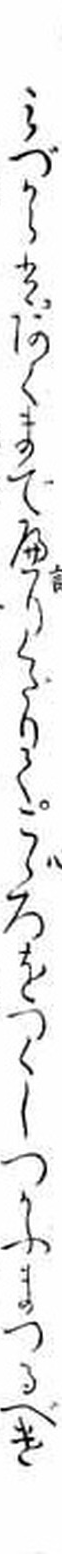みづからは。あくまでへりくだりて。こゝろをつくしつかふまつるべけ
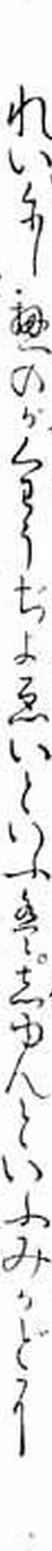れ。いにしへのがくわうぢよゑいといふは。しゆんといふみかどに
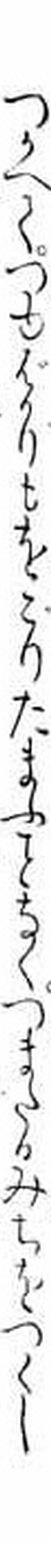つかへて。つゆばかりもをごりたまふことなく。つまたるみちをつくし
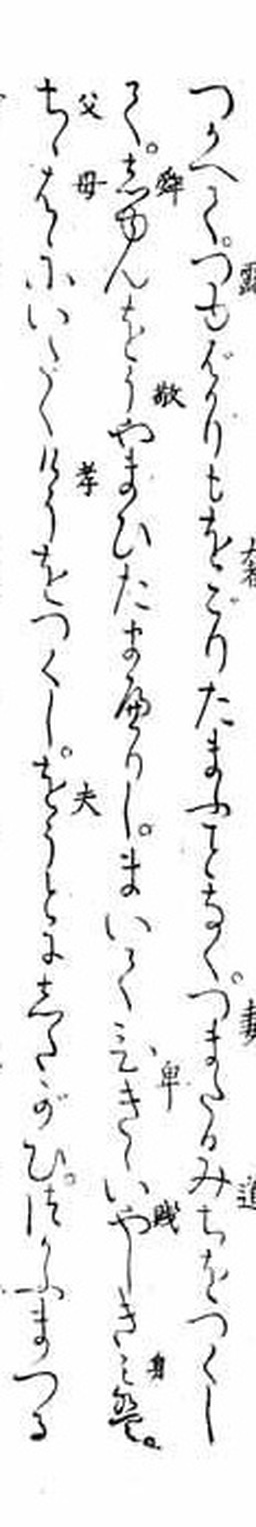て。しゆんをうやまひたまへりし。まいてひきしいやしきみは。
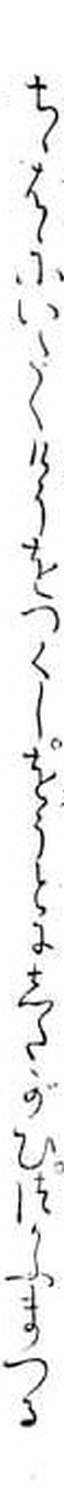ちゝはゝにいたくけうをつくし。おうとにしたがひ。つかふまつる
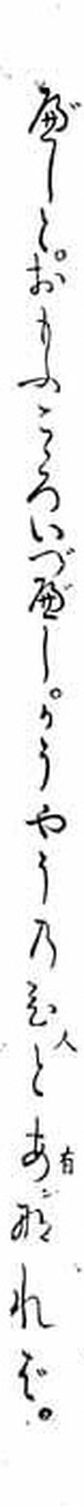べしと。おもふこゝろいづべし。かうやうのひとあンなれば。
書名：女学範
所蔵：東京学芸大学教育コンテンツアーカイブ
